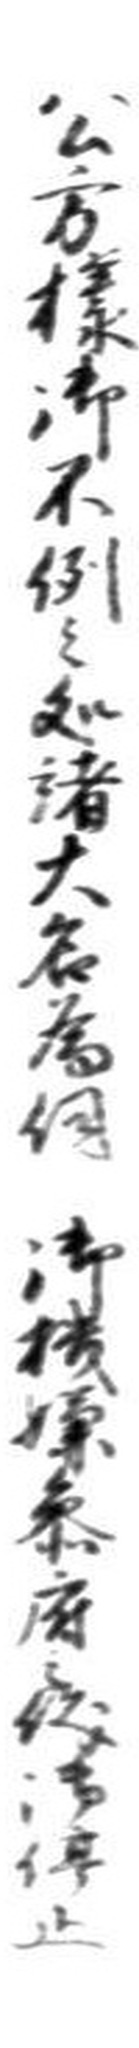公方様御不例之処諸大名為伺御機嫌参府之儀御停止
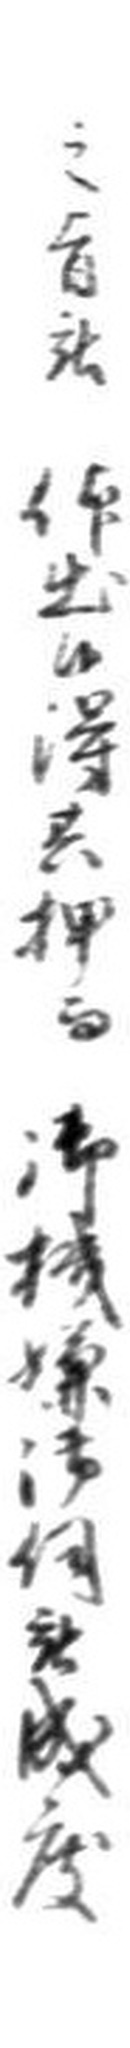之旨被仰出候得共押而御機嫌御伺被成度
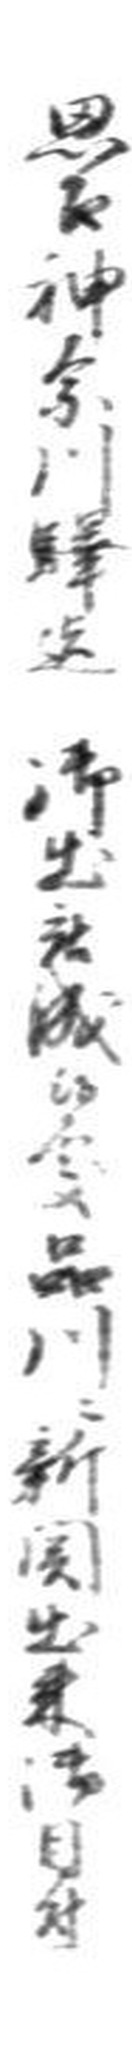思召神奈川駅迄御出被成候処品川ニ新関出来御目付
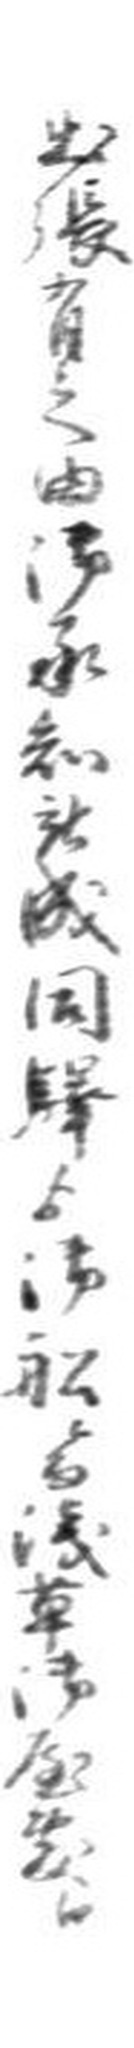出張有之由御承知被成同駅ゟ御舩ニ而浅草御屋敷江
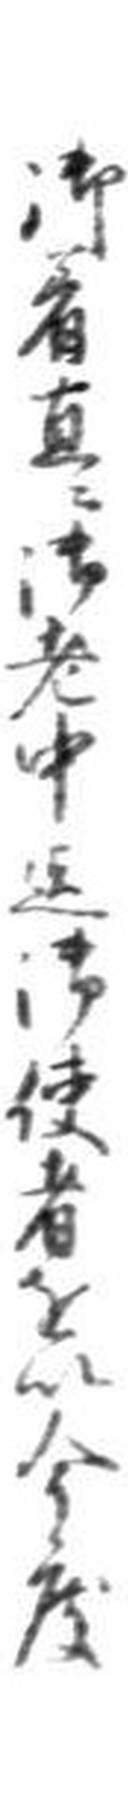御着直ニ御老中迄御使者を以今度
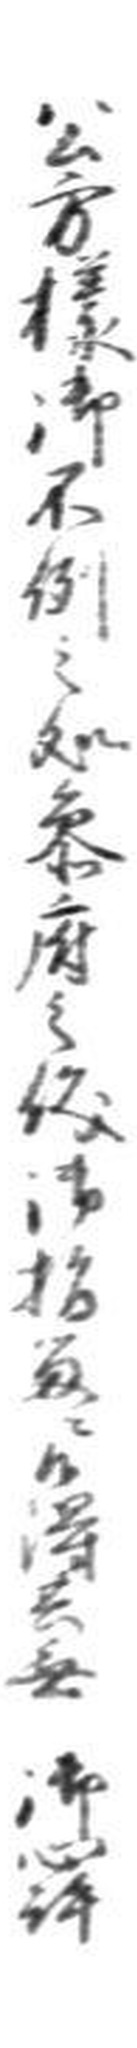公方様御不例之処参府之儀御指留ニ候得共無御心許
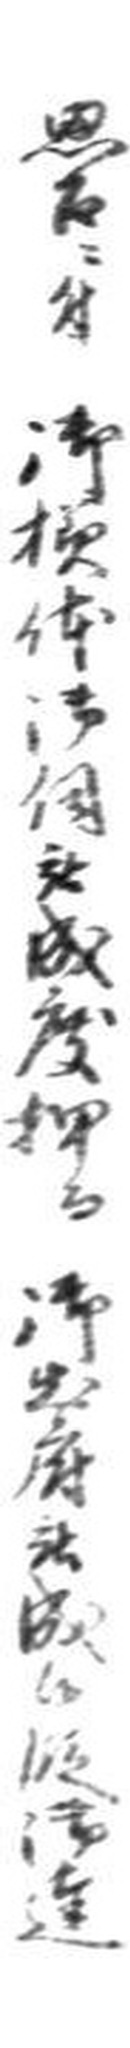思召ニ付御様体御伺被成度押而御出府被成候段御達

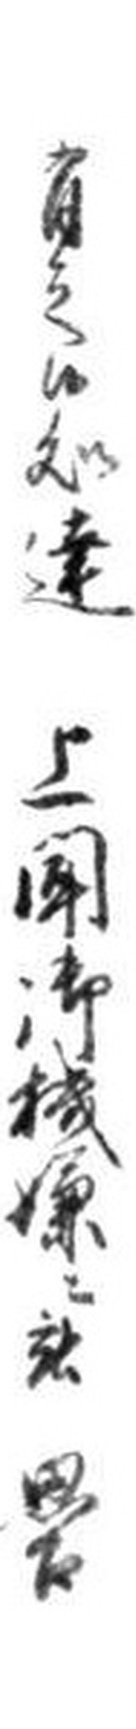有之候処達上聞御機嫌ニ被思召
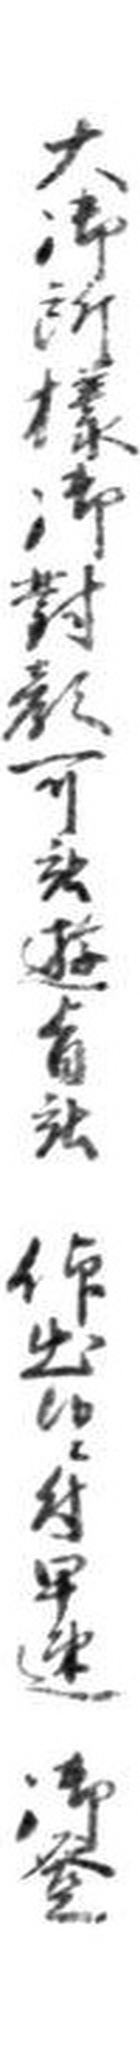大御所様御対顔可被遊旨被仰出候ニ付早速御登
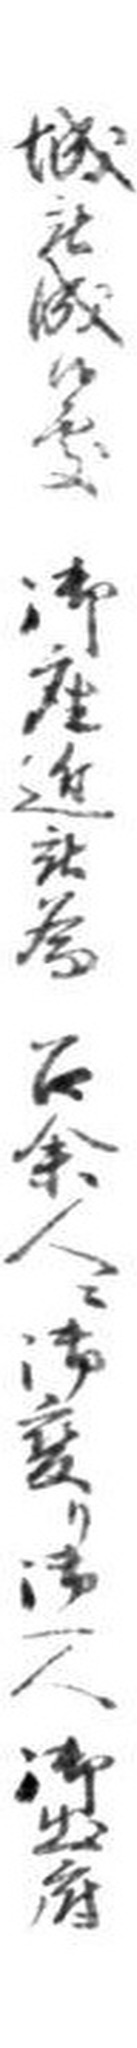城被成候処御座近被為召余人ニ御変り御一人御出府
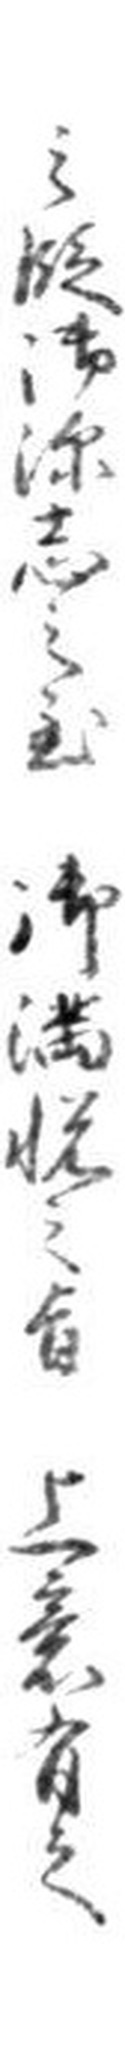之段御深志之至御満悦之旨上意有之
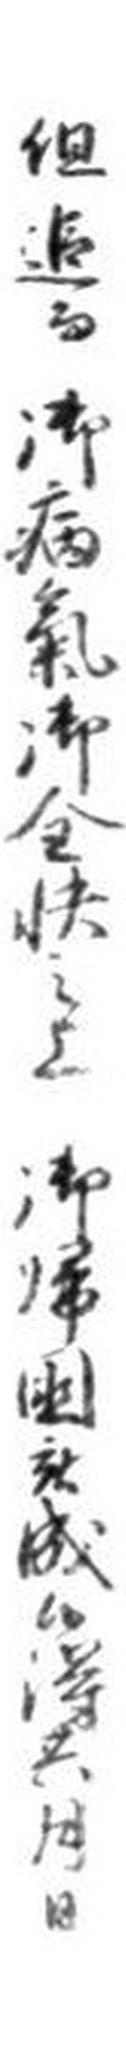但追而御病気御全快之上御帰国被成候得共月日
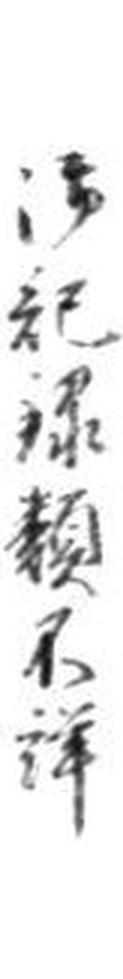御記録類不詳
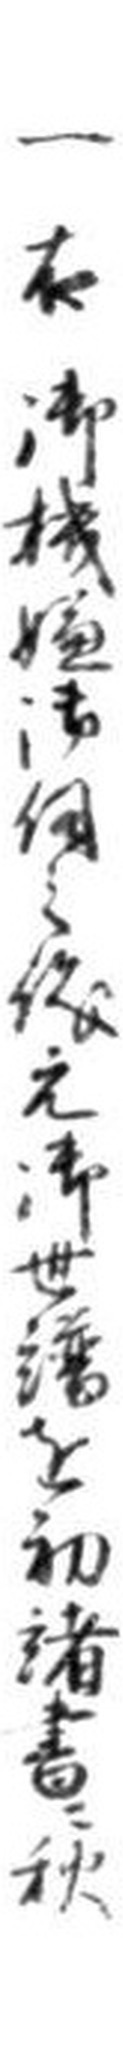一右御機嫌御伺之儀元御世譜を初諸書ニ秋
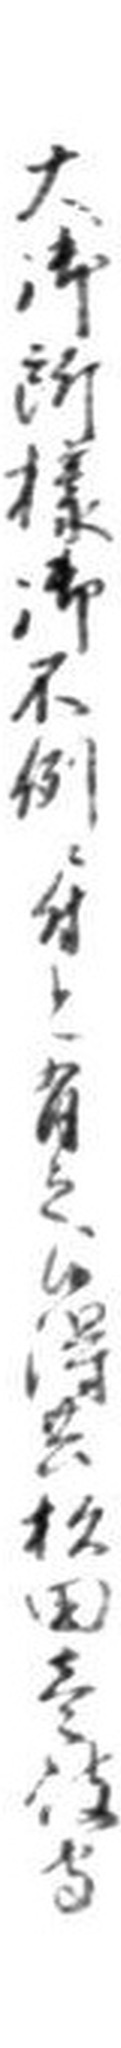大御所様御不例ニ付と有之候得共杉田壱岐守
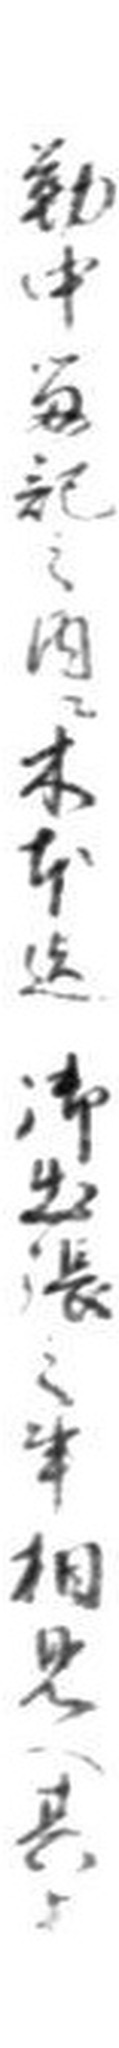勤中留記之内ニ木本迄御出張之事相見へ其上
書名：家譜 三 忠昌公 従慶長八年到寛永六年
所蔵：福井県文書館 Fukui Prefectural Archives
